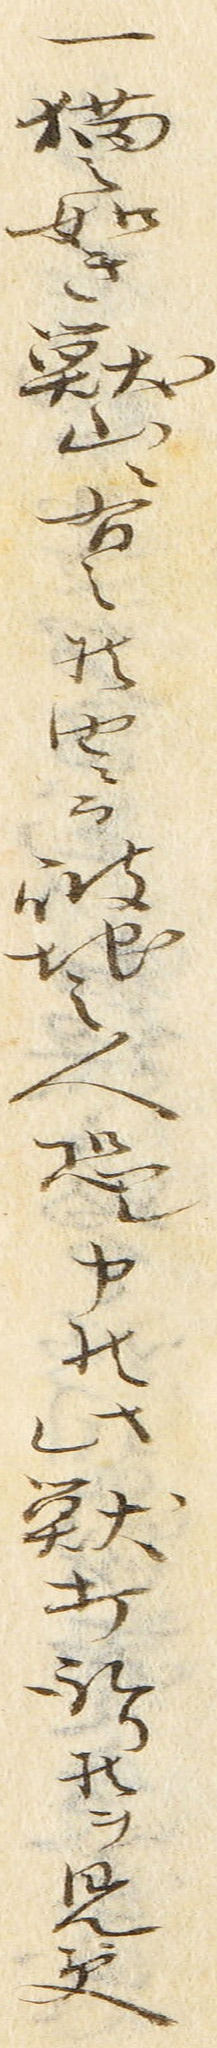一猫之如き獣山に有之候由に而彼地之人恐れ申候此獣打取候ヲ見受
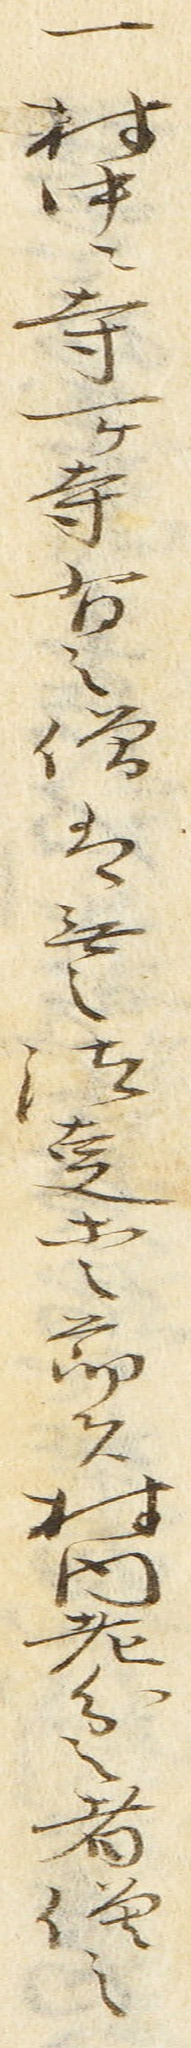一村中に寺一ケ寺あ有之僧は無之法事等之節は村内老分之者僧之
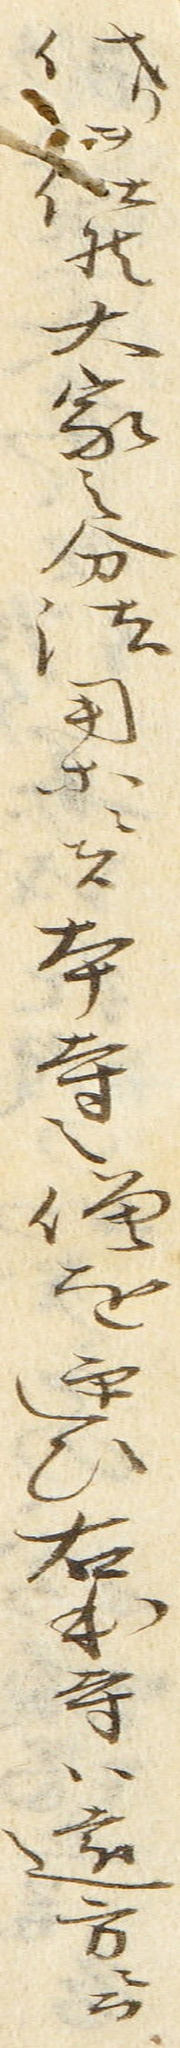代りヲ仕候大家之分法用等には本寺之僧を連ひ右本寺は遠方に而
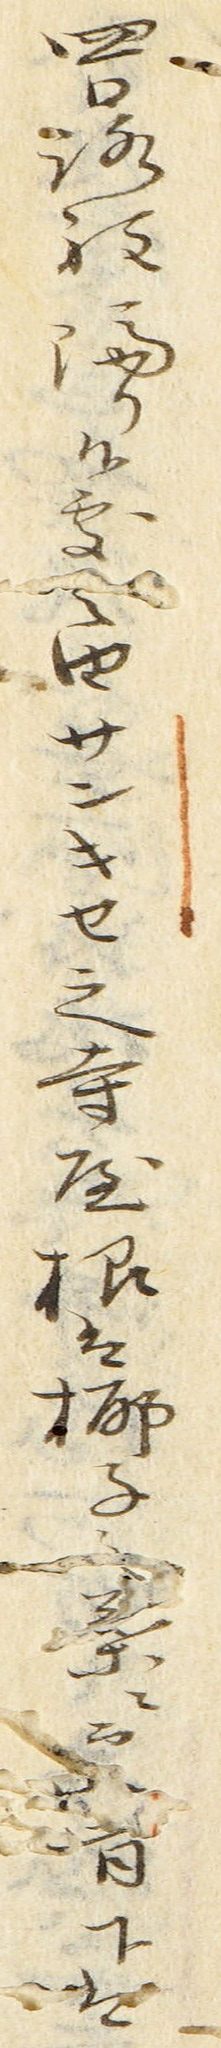四日路程隔り候處之由サンキセ之寺屋根は椰子葉に而？？下は

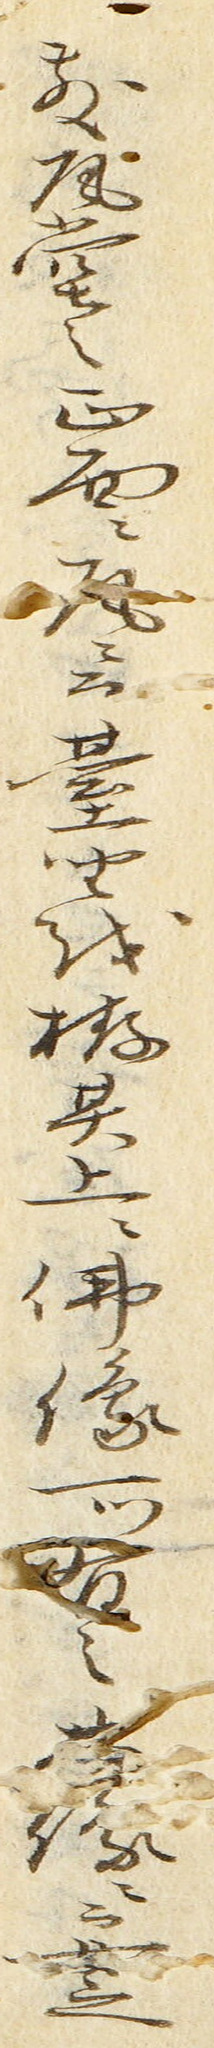前瓦堂之正面に瓦に而台坐を栫其上に像一ツ有之？像に而蓋
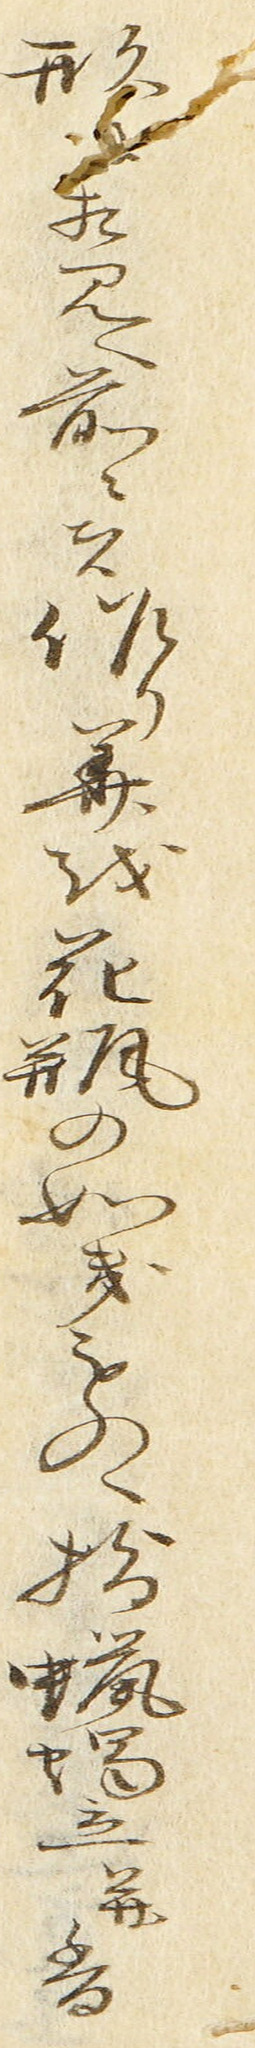形？相見へ前には作り華を花瓶の如義ものへ指蝋燭立並香
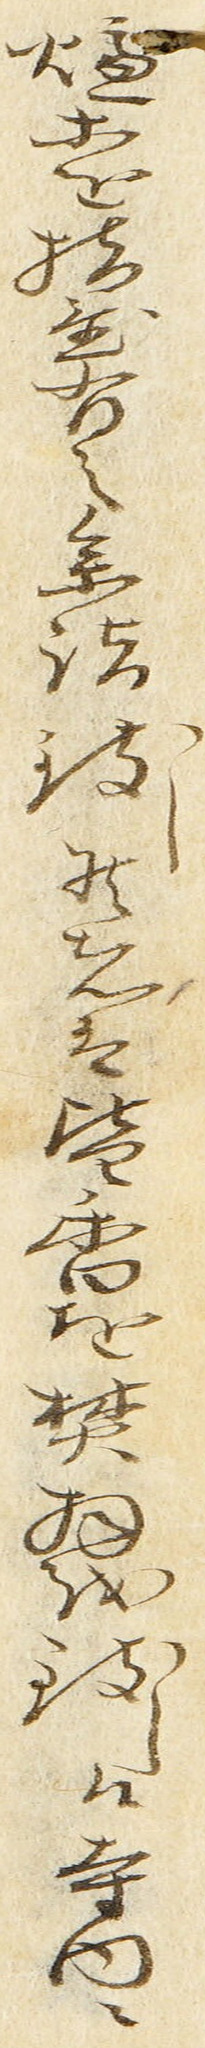燭等を指置有之参詣致し候者は香を焚拝を致し候寺内に
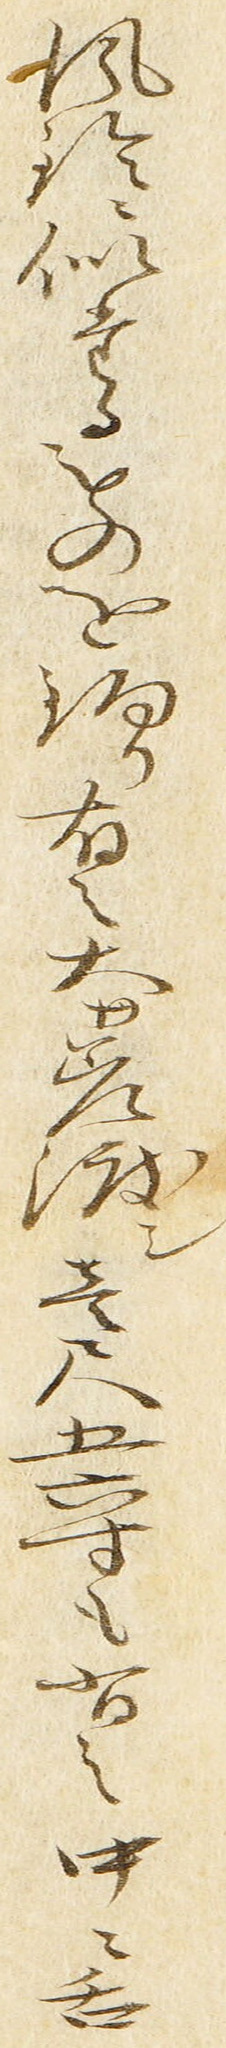風鈴に似たるものを釣り有之大口差渡し壱尺五六寸も有之中に舌
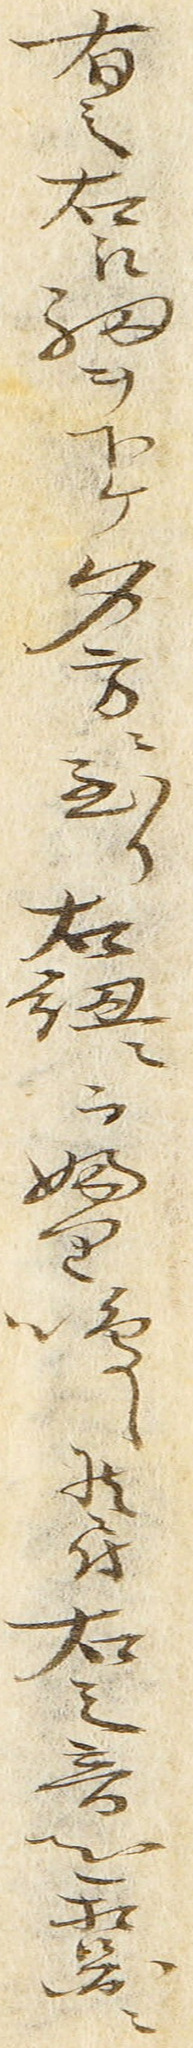有之右江紐ヲ下ケ夕方に至り右紐に而ふり鳴し候に付右之音を相図に
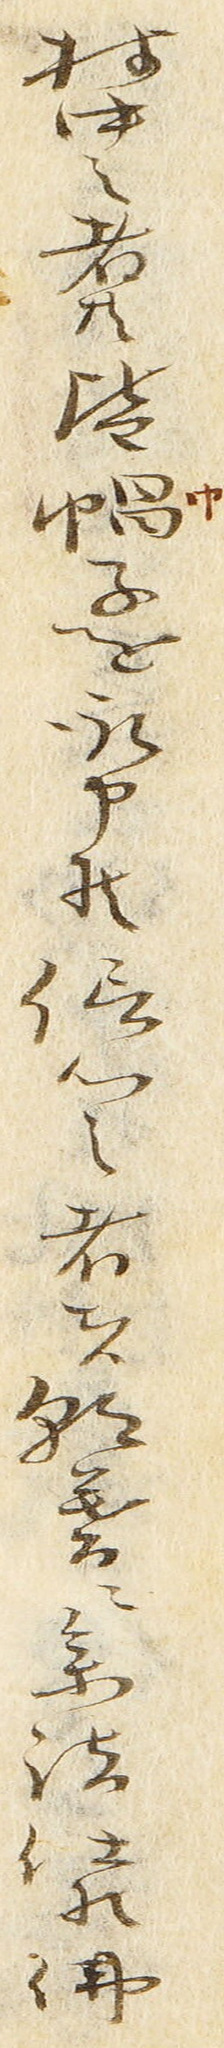村中之者共皆帽子を取申候信心之者朝暮に参詣仕候仏
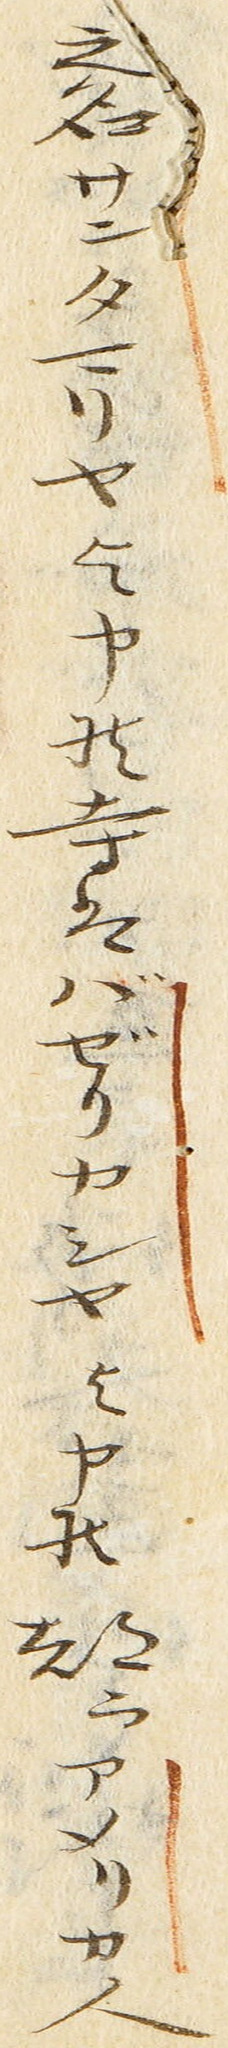之名サンタマリヤと申候寺はバゼリカシヤと申候却而アメリカ人
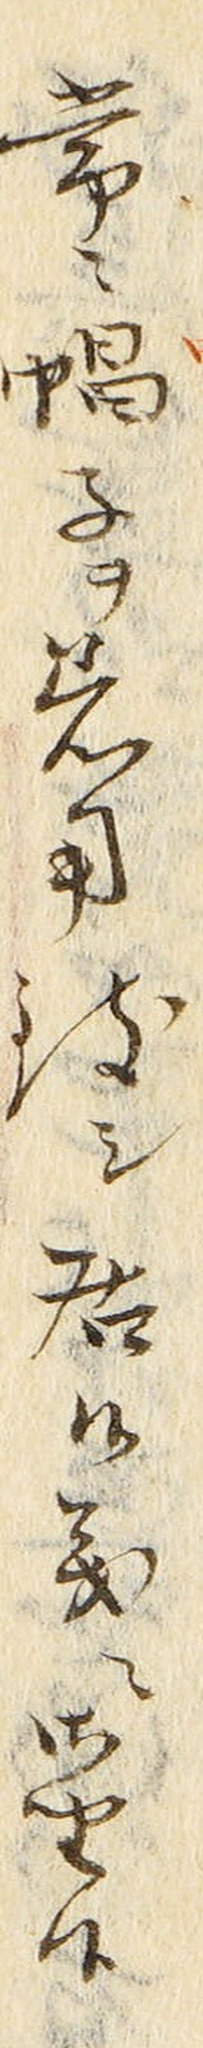常に帽子ヲ着用致し居候義に御座候
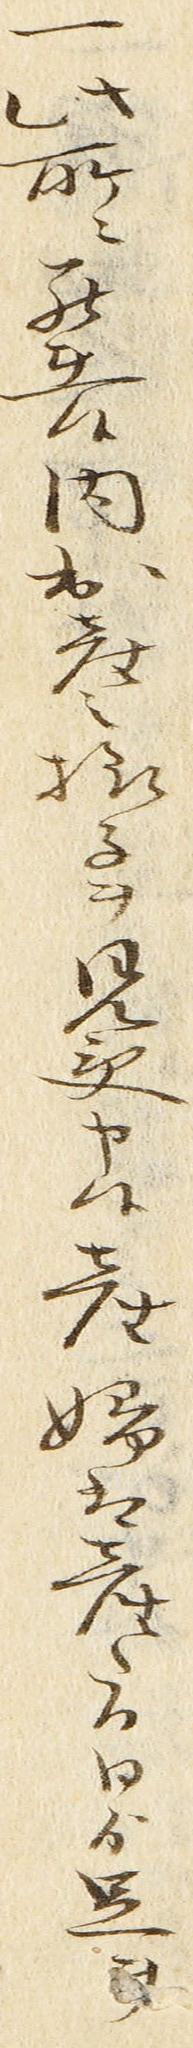一此所に能在候内出産之様子ヲ見受も申候産婦は産たる日ゟ是ヲ
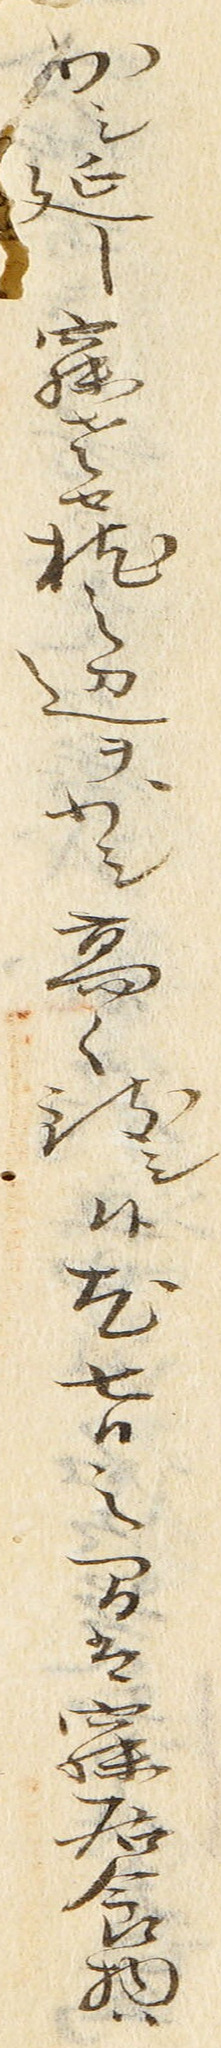少し延し寝？セ枕之辺ヲ少し高く致し候尤七日之間は寝居食物は
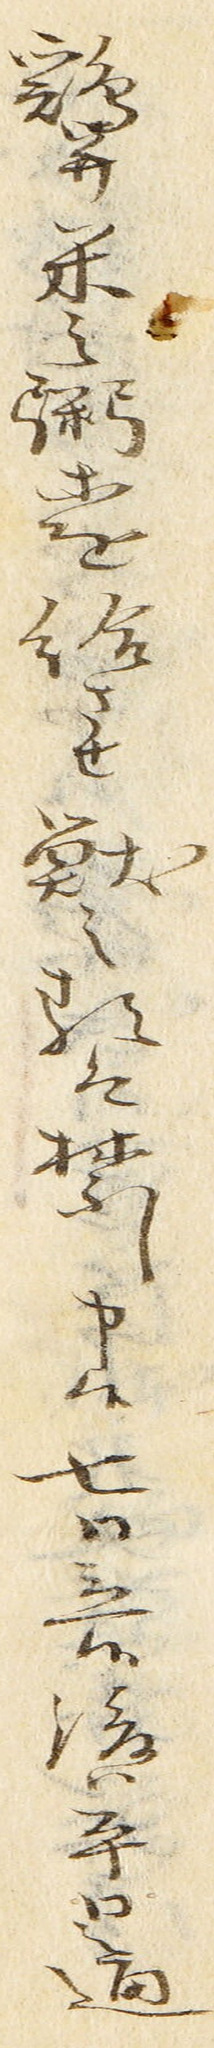鶴並米之粥唐等を給させ獣の類は禁し申候七日立候後は平日之通
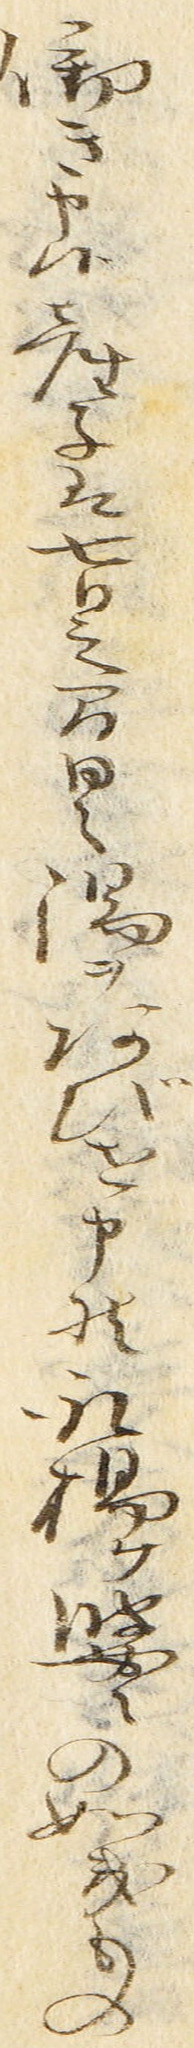働き申候産子は七日之間日々湯ヲあびせ申候取揚ケ婆婆の如幾もの
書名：漂流人弥市之記
